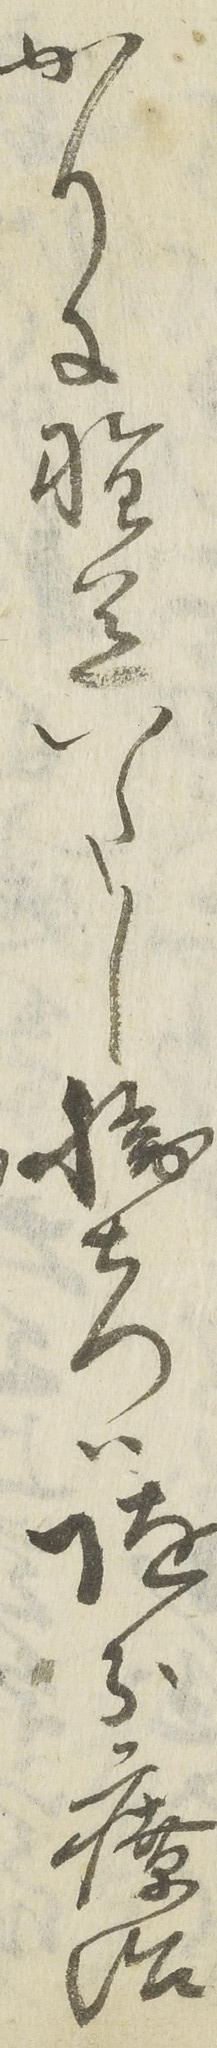かりに野送いたし勝右衛門は随分療治
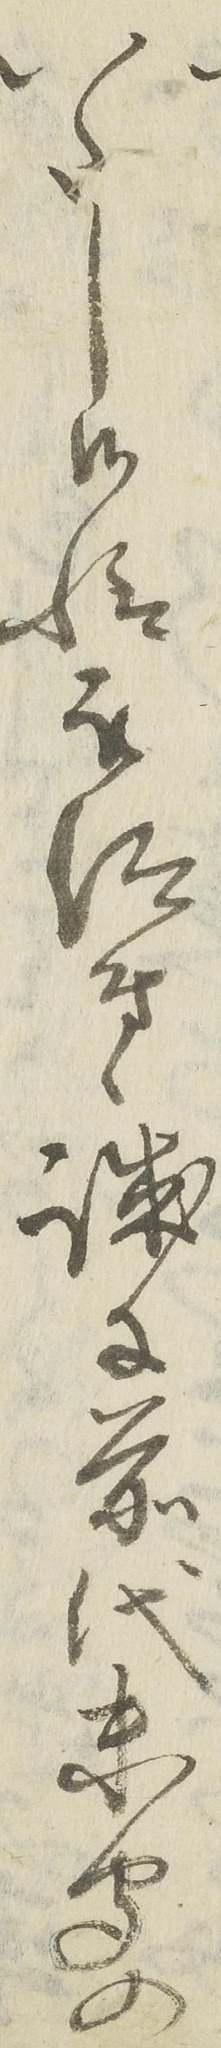いたし候様被仰付候誠に前代未聞の
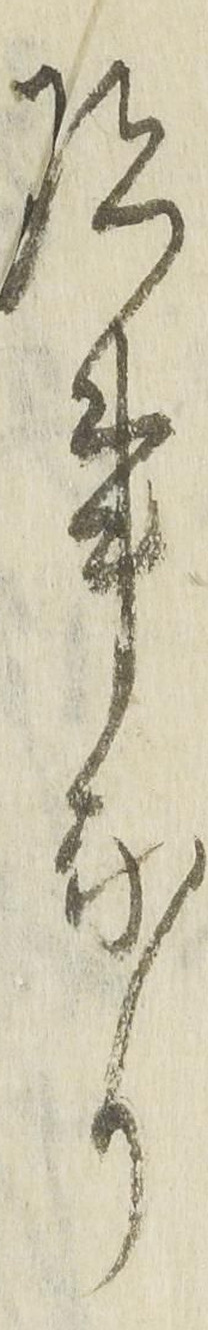珍事なり
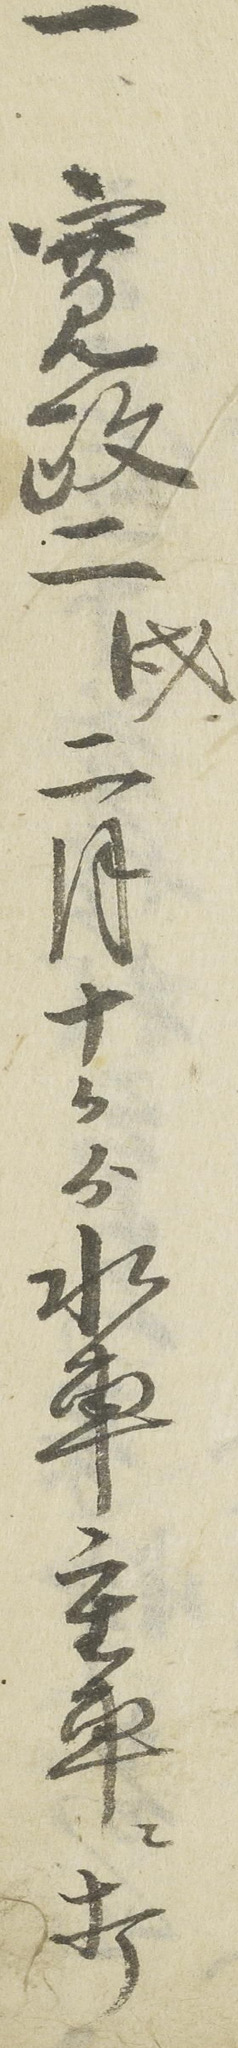一寛政二戌二月十日ゟ水車重車ニ打

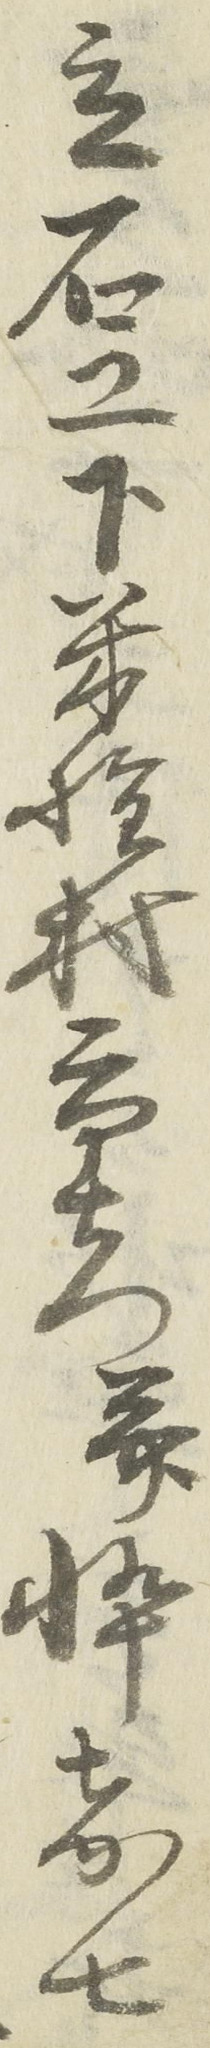立石工下米拾村市右衛門幷忰嘉七
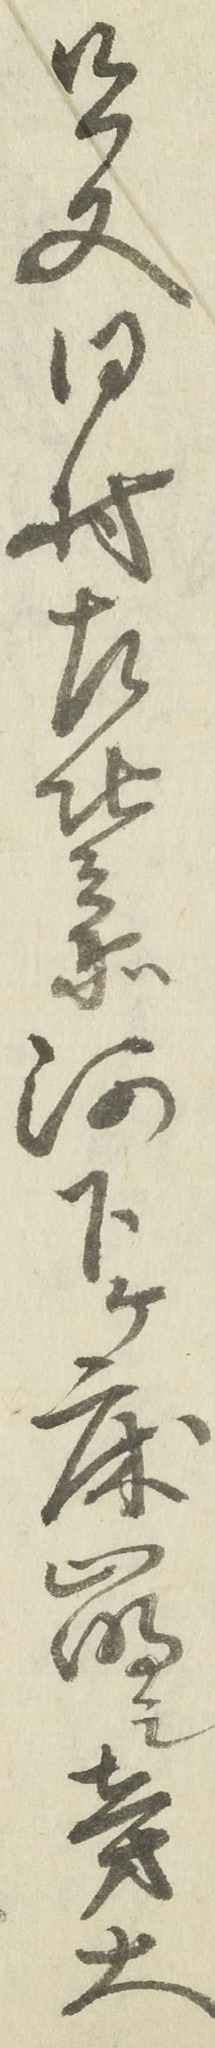且又同村左次兵衛河下ケ床崩シ旁大
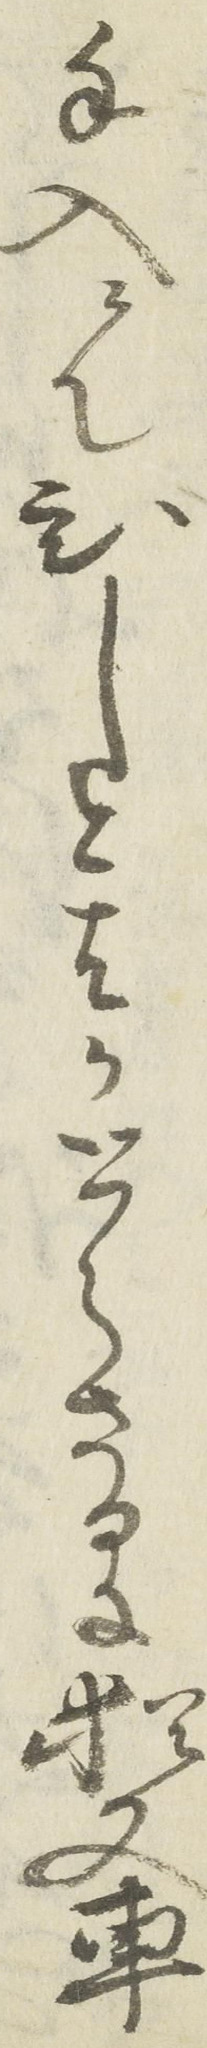手入ニてひしとはかとらさるに猶又車
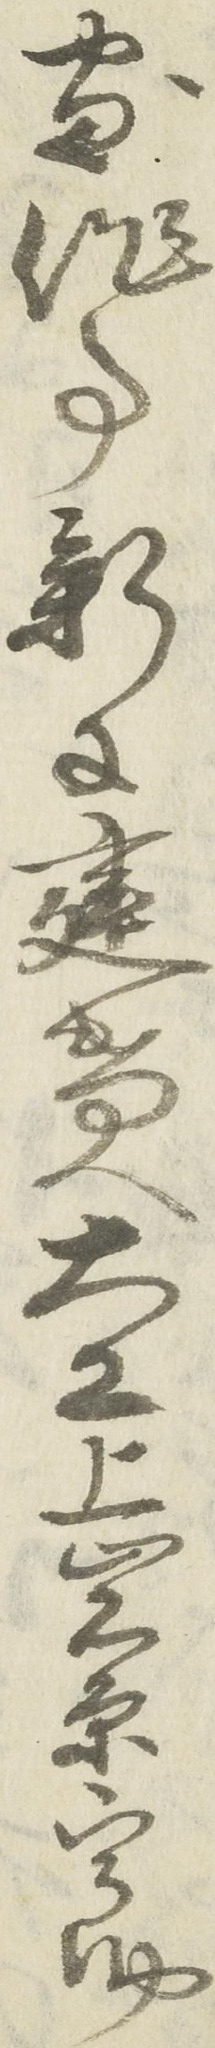家作事新に建替へ大工上岩原宇助
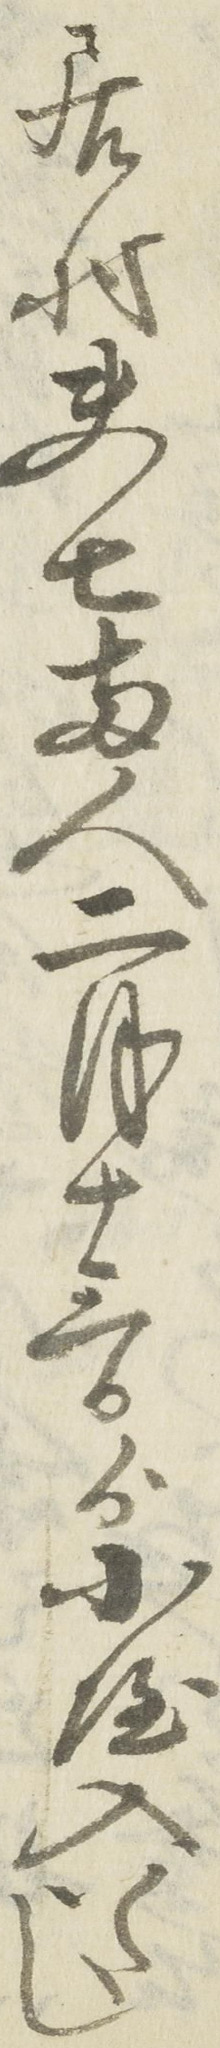居村夫七両人二月十三日ゟ小屋入いたし
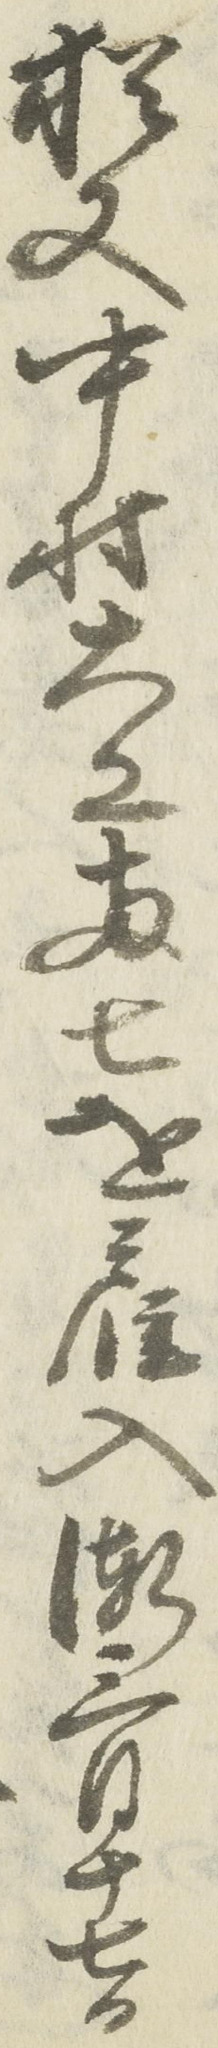猶又中村大工両七を雇入漸三月十七日
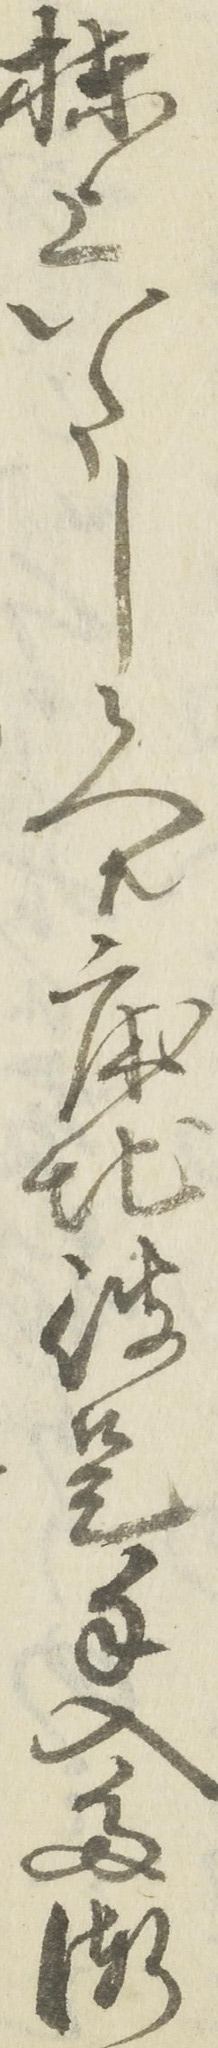棟上いたし候へ共床地彼是手入多漸
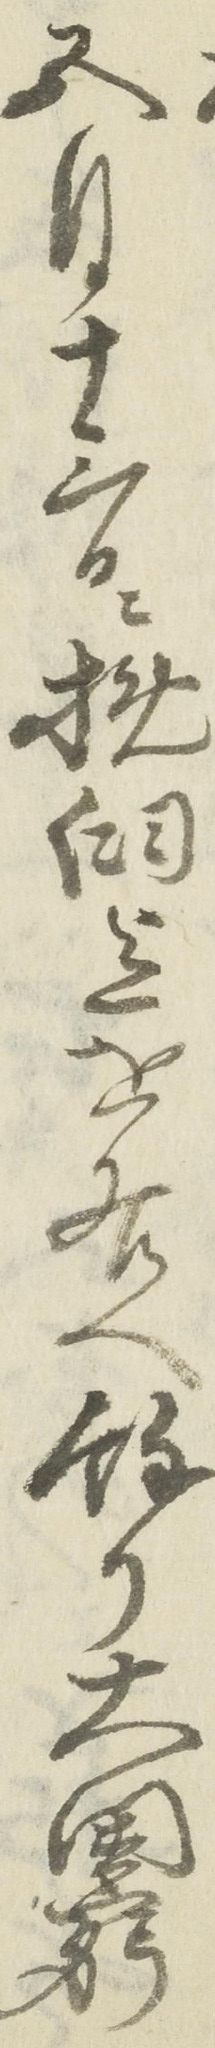五月十三日ニ挽臼迄を居へ余り大困窮
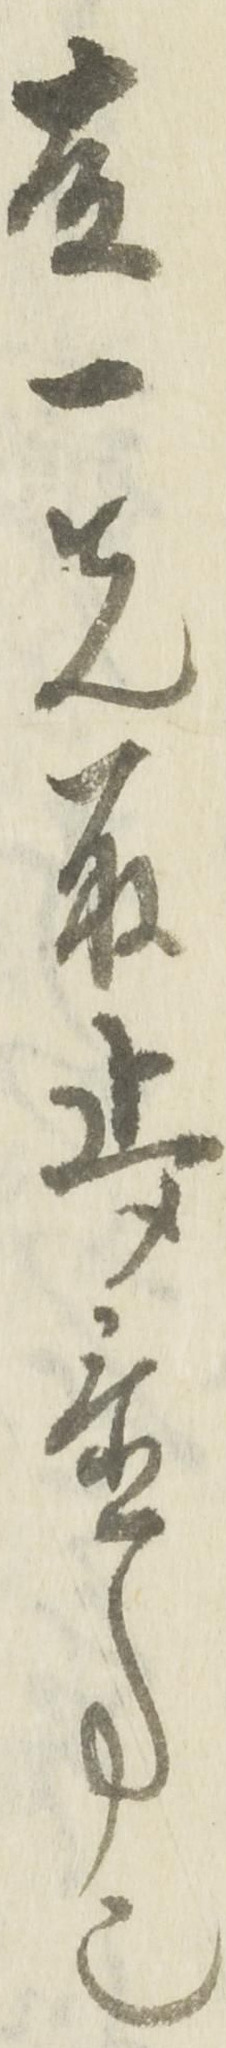故一先取止メ置事也
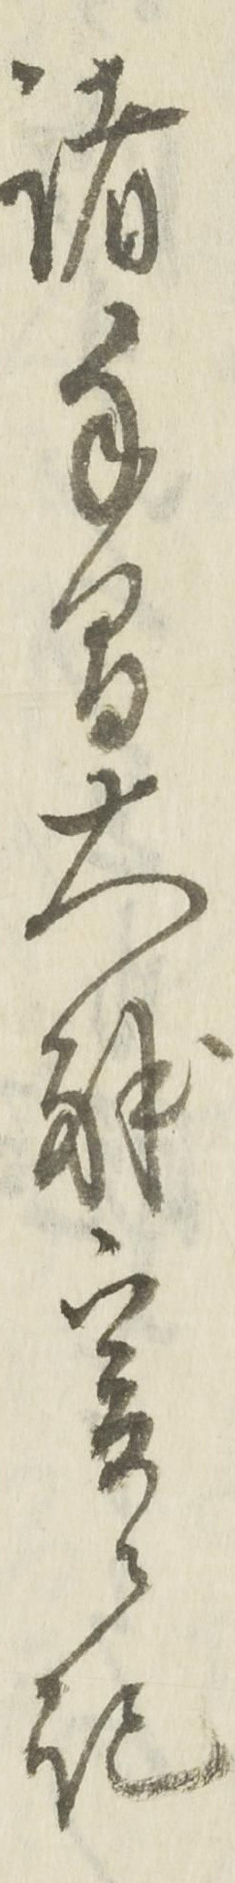諸手間大体爰ニ記
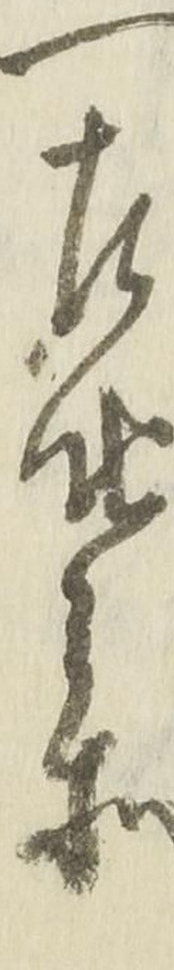左次兵衛
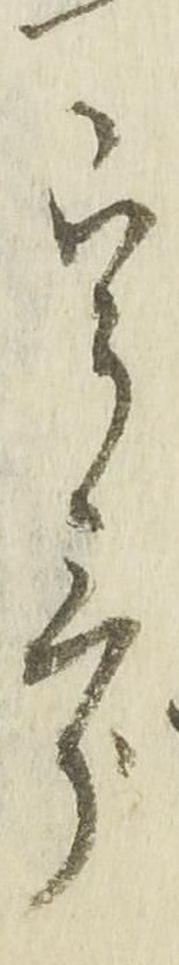宇三郎
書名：後見笑
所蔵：東京大学地震研究所図書室 Earthquake Research Institute Library, The University of Tokyo, JAPAN
